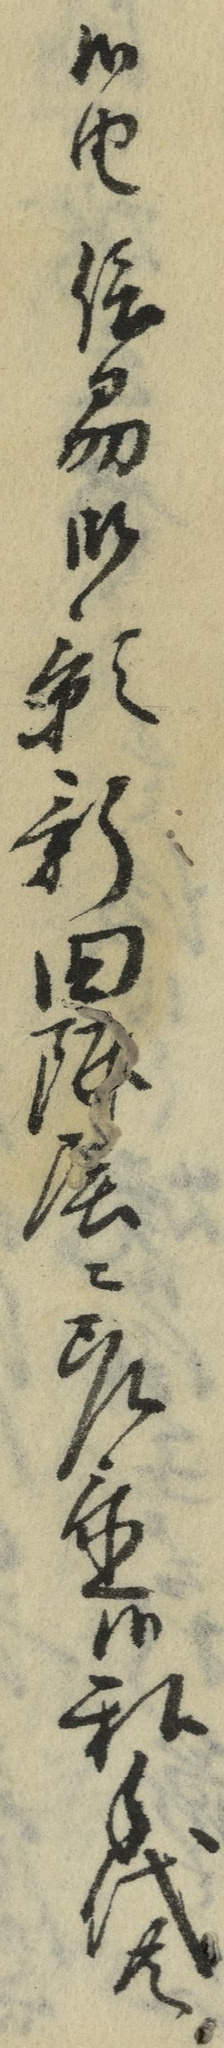候由信州御影新田陣屋に差置候私手代共
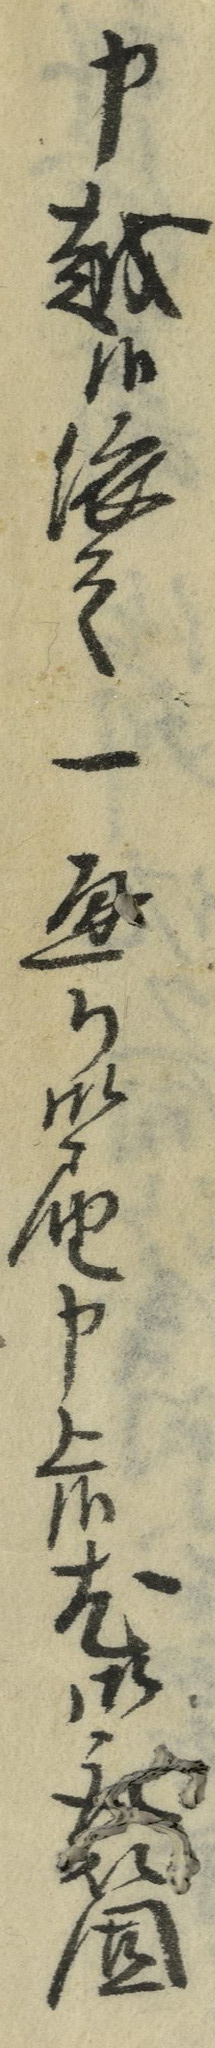申越候依之一通り御届申上候尤御取箇
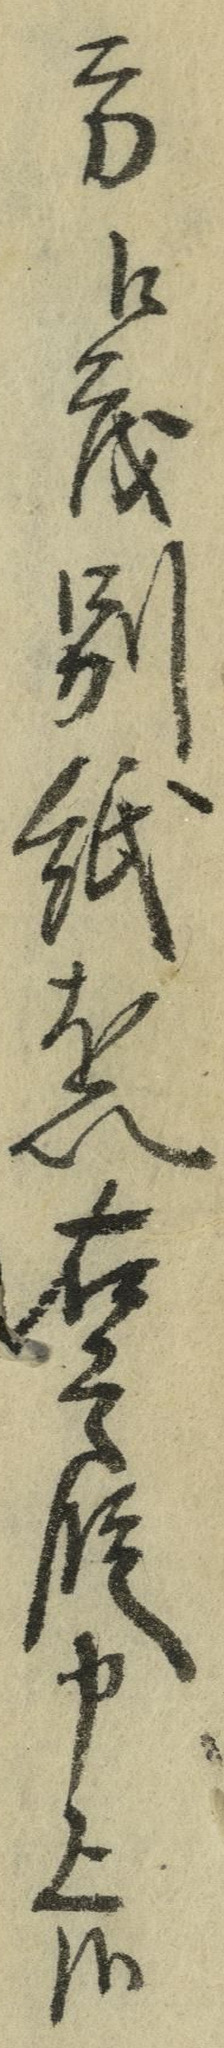方えも別紙を以右之段申上候
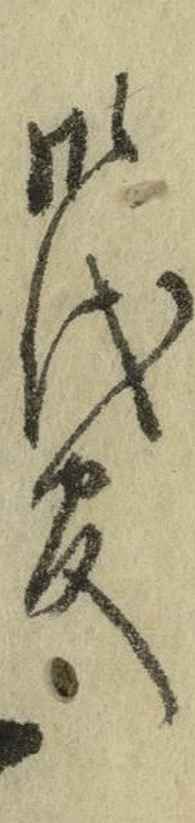御代官
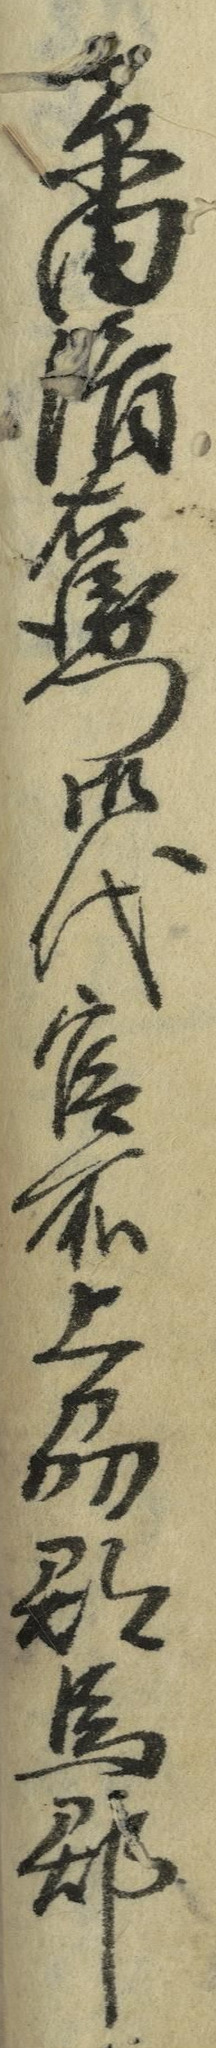原田清右衛門御代官所上州郡馬郡
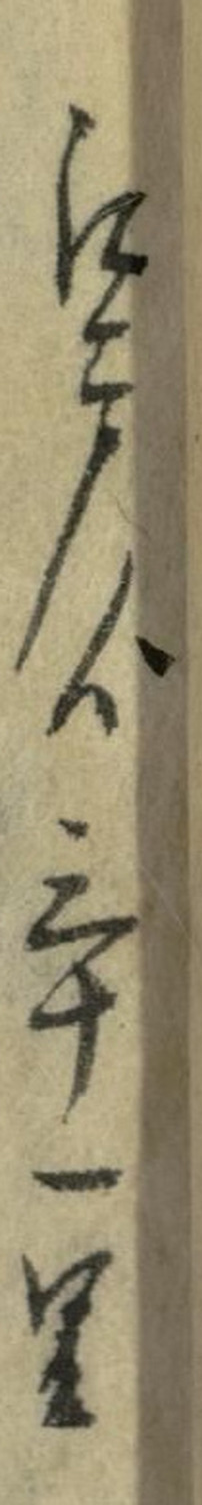江戸ゟ三十一里
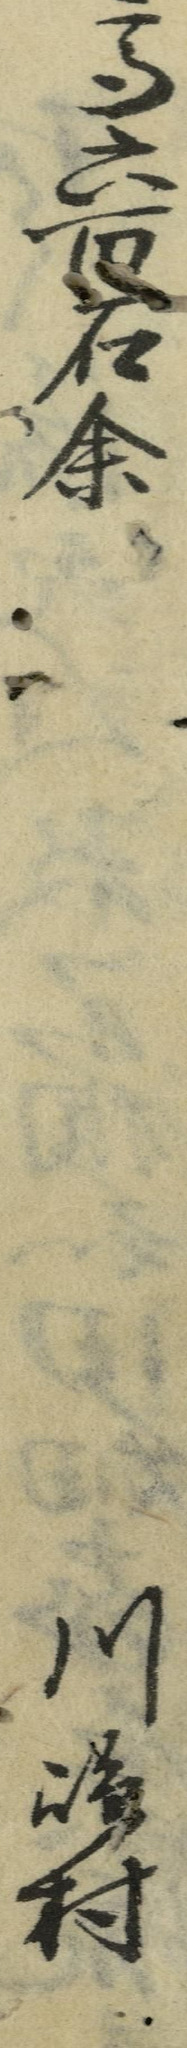高六百石余川嶋村
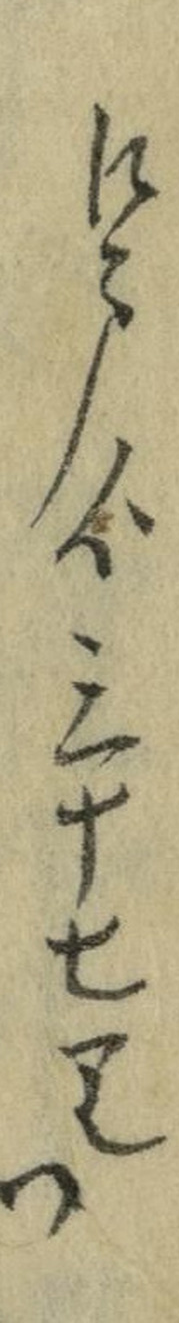江戸ゟ三十七里
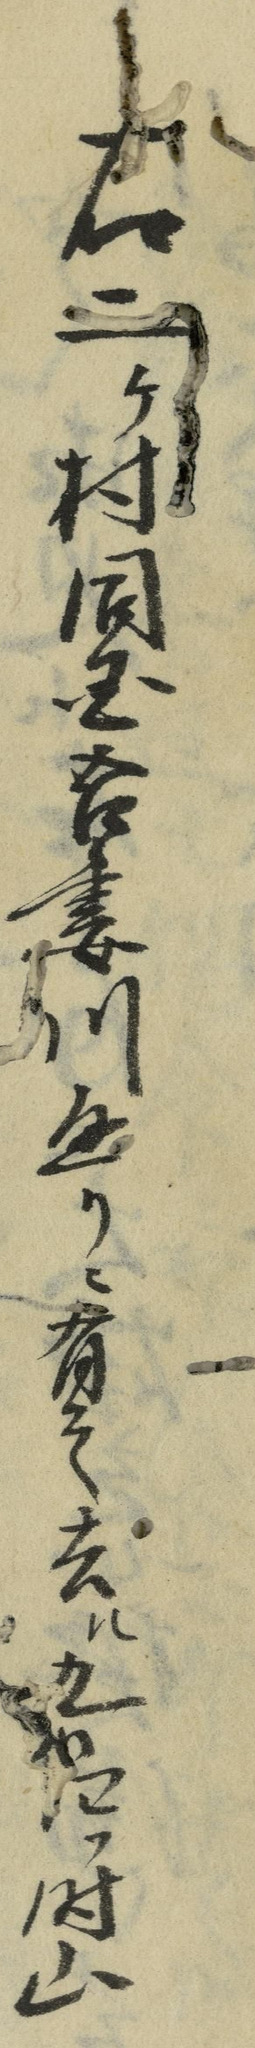右二ケ村同国吾妻川通りに有之去ル九日四ツ時山
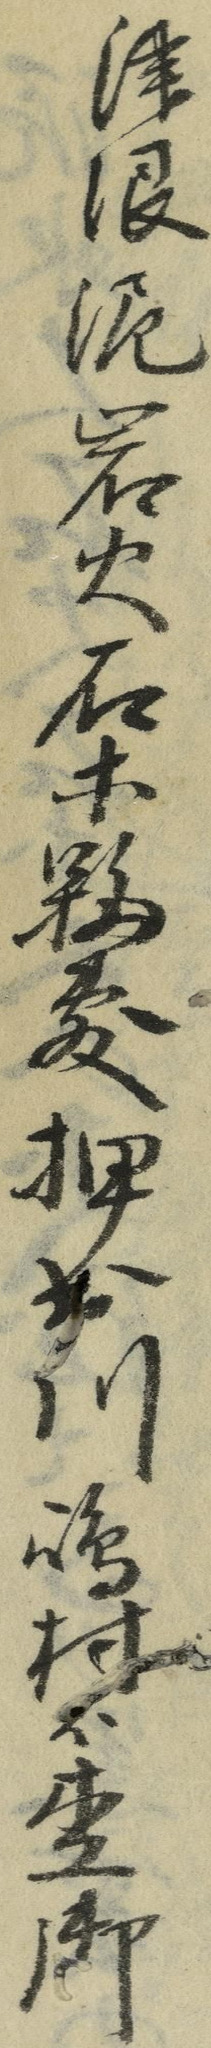津波泥岩火石等夥敷押出川嶋村ゟ杢御
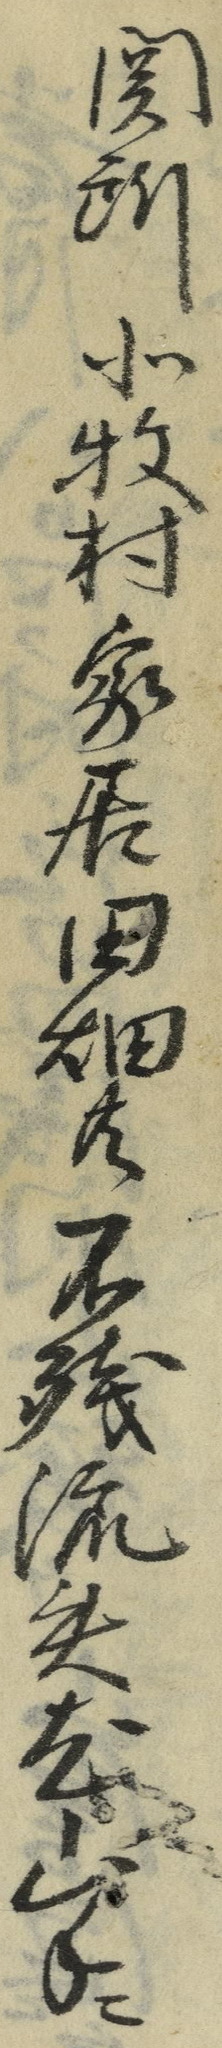関所北牧村家居田畑共不残流失尤山手に
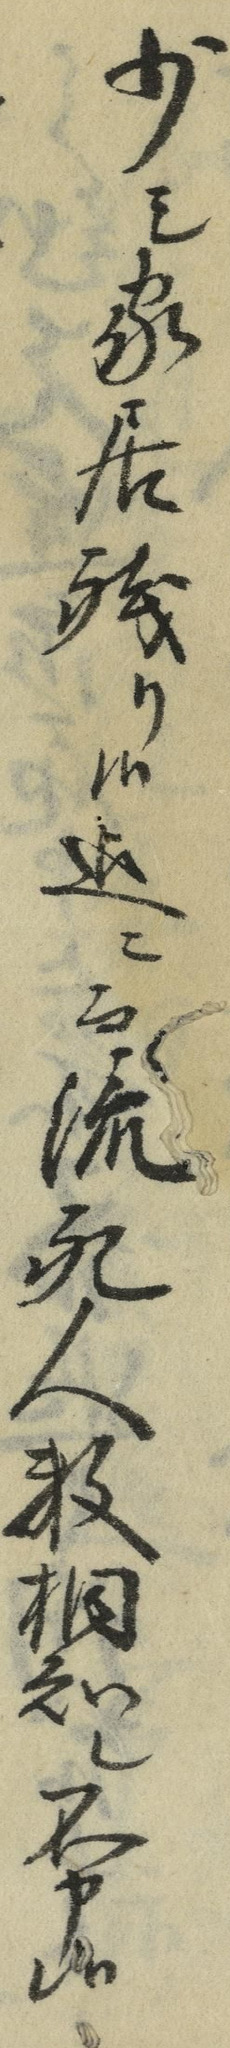少シ家居残り候迄に而流死人数相知レ不申候
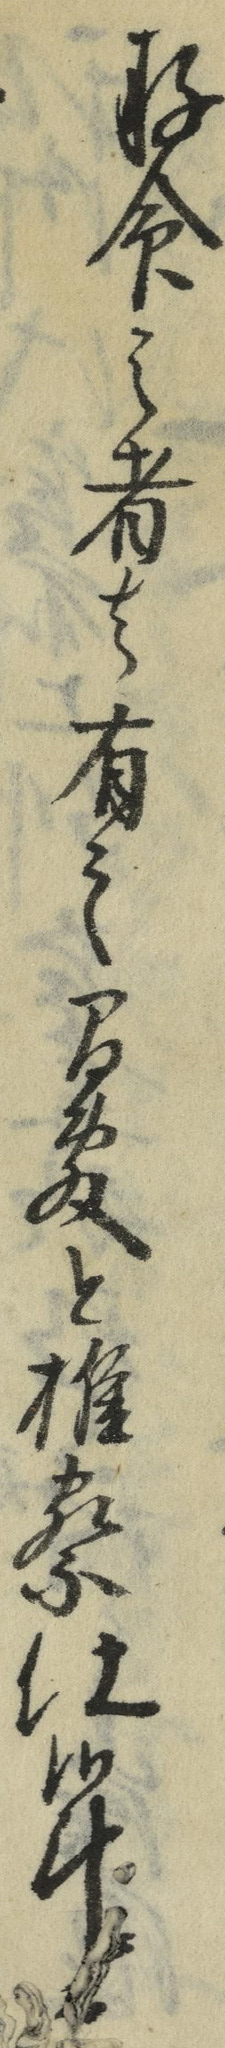存命之者は有之間敷と推察仕候計に而
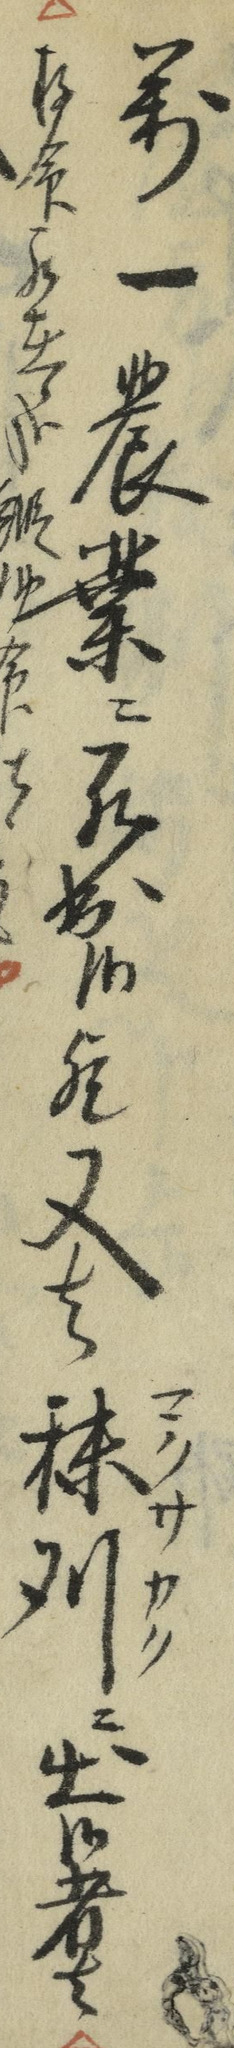万一農業に罷出候歟又は秣刈に出候者者△
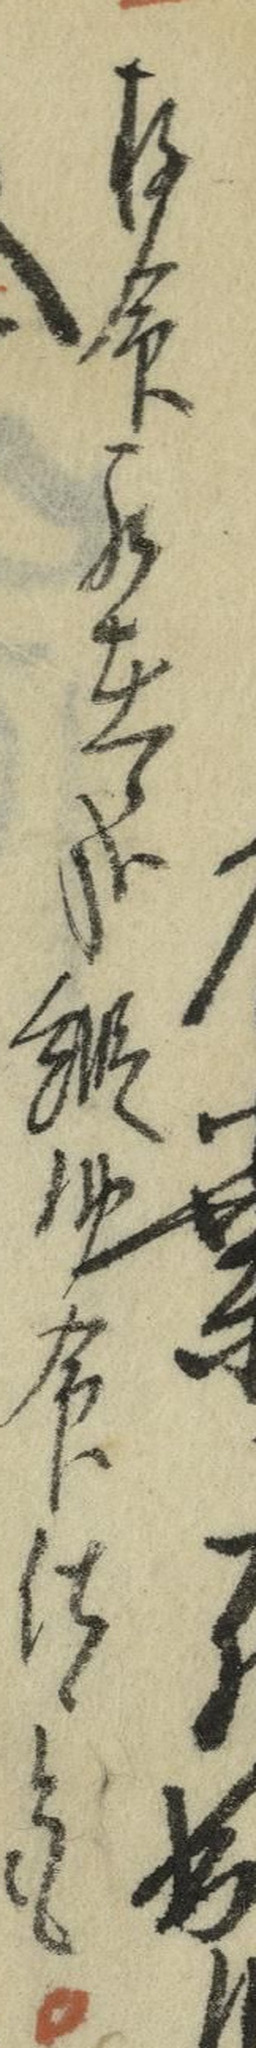△存命罷有候哉縦助命仕候とも○
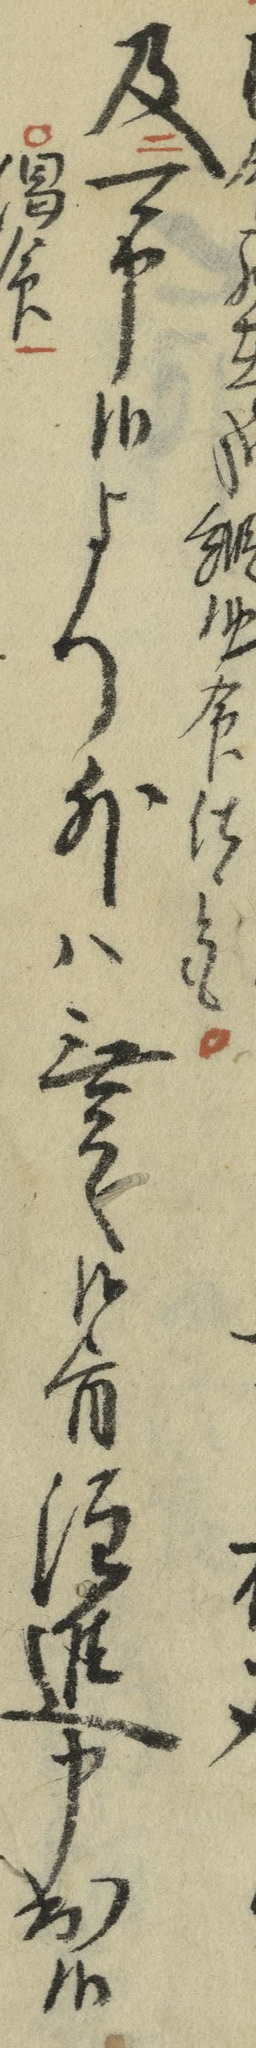及可申候より外は無之候旨注進申出候
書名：天明三卯年七月　浅間山焼注進写
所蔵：東京大学地震研究所図書室 Earthquake Research Institute Library, The University of Tokyo, JAPAN
